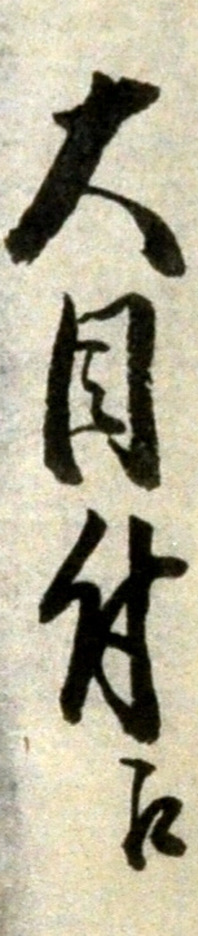大目付え

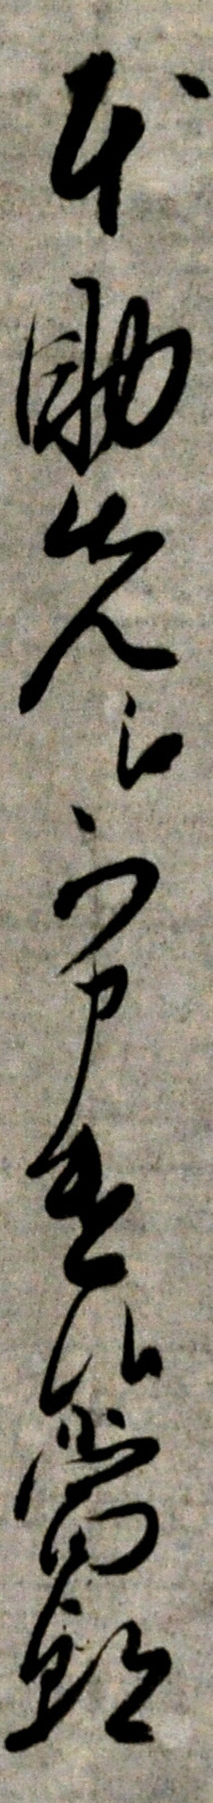本助先え可申遣候当朝
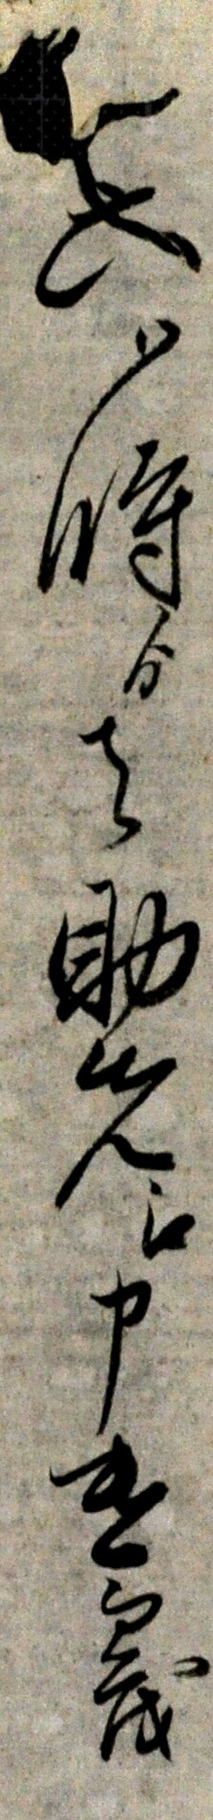五ツ時ゟは助先え申遣ても
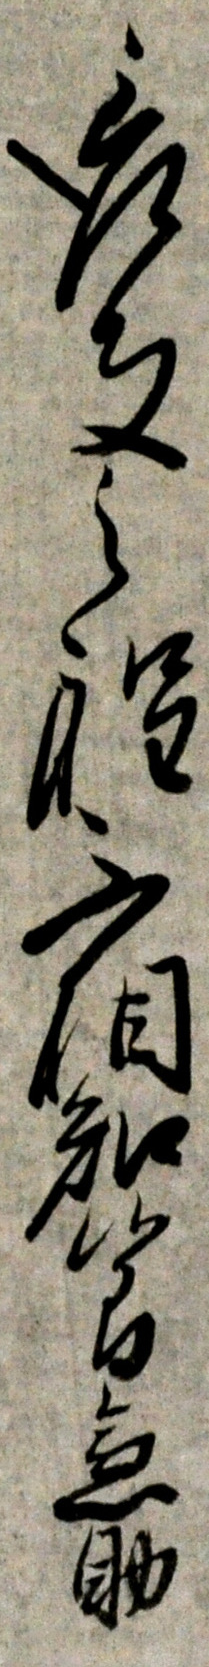差支之程不相知候間急助
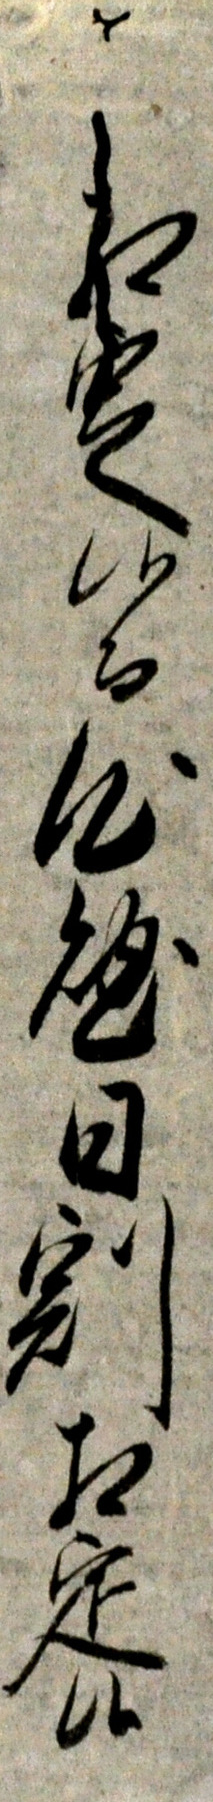相定候て心懸日割相定候
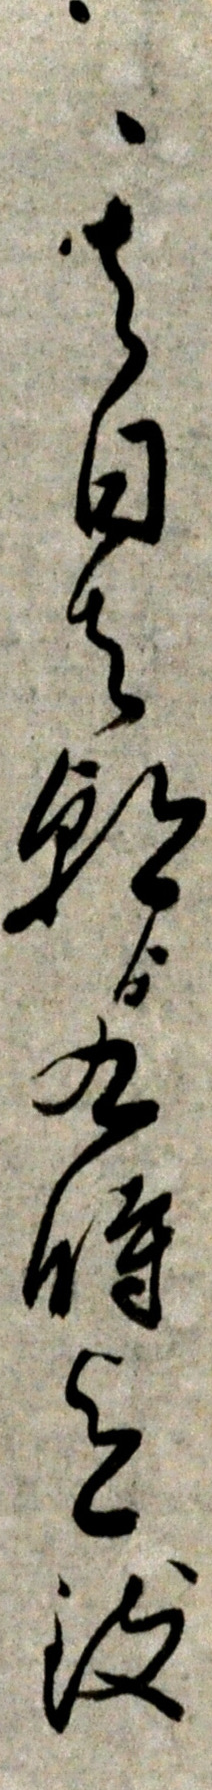其日は朝ゟ九時迄致
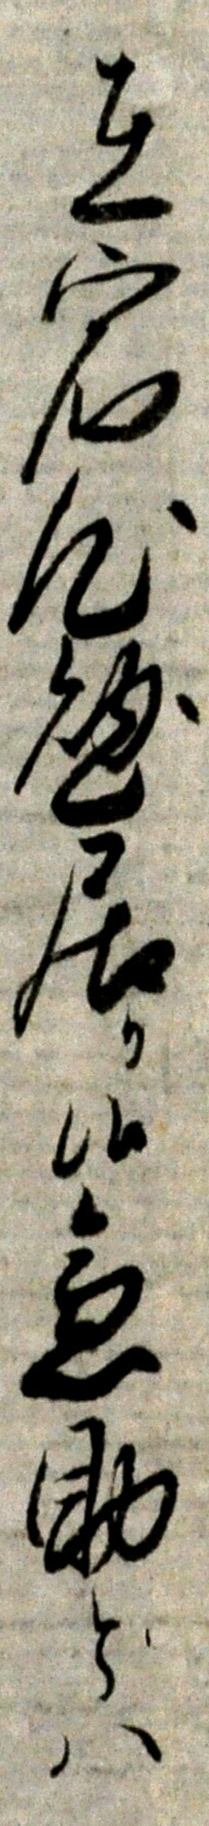在宿心懸居り候急助とは
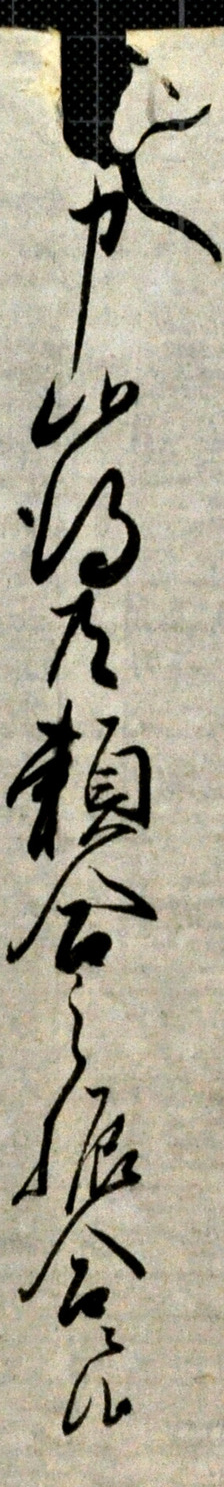申候得共頼合之振合に候
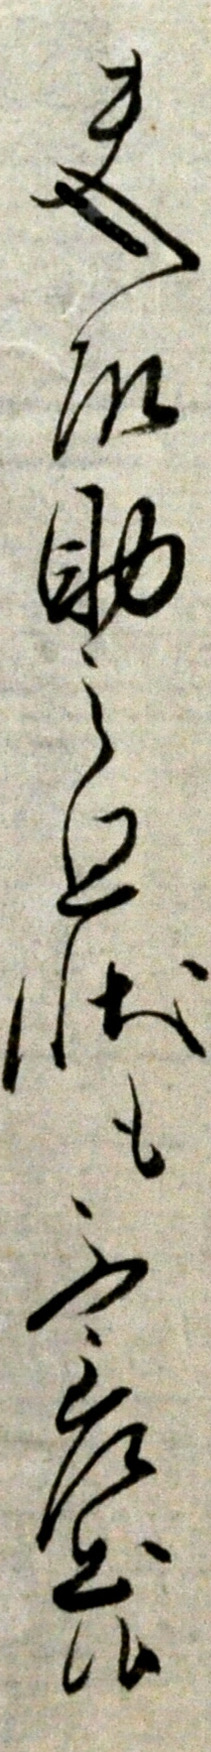夫故助之廻状も不差出候

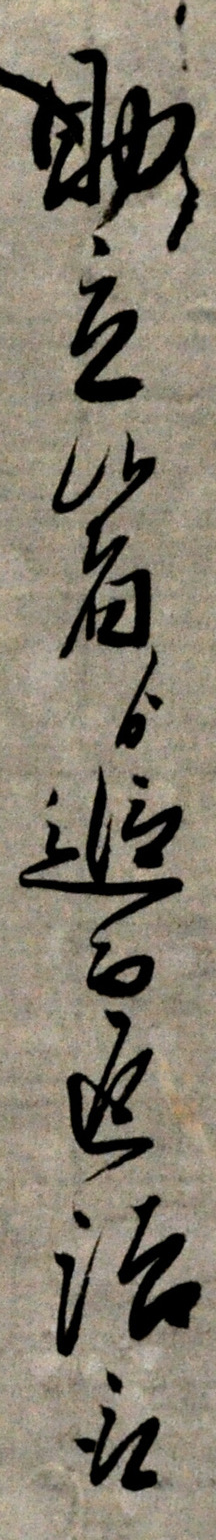助立候者ゟ追て返詰取
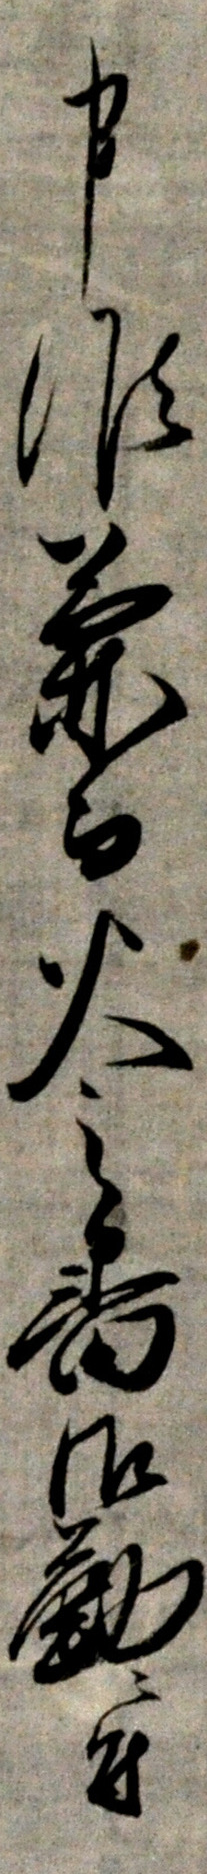申候兼て火之番御勤に付
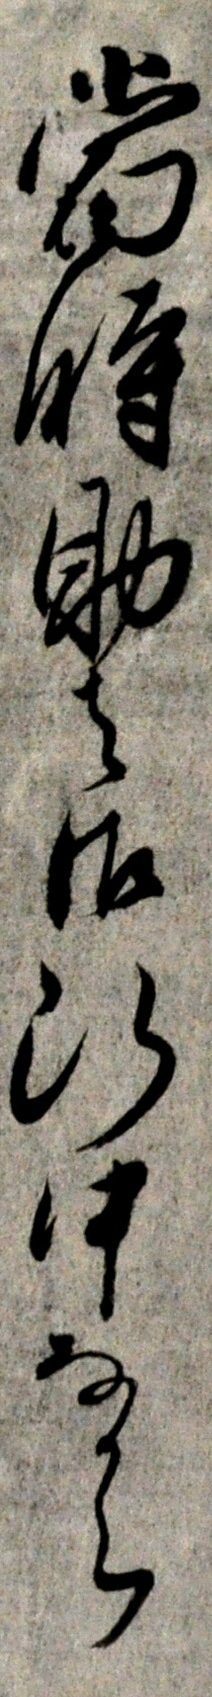当時助は御断中なから
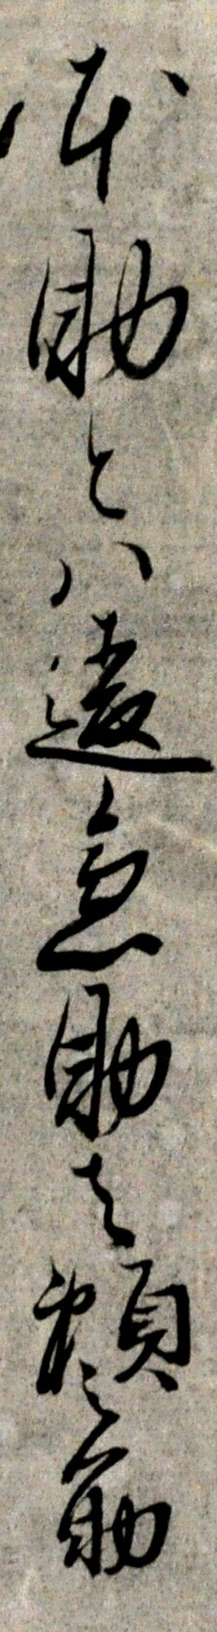本助とは違急助は頼之筋
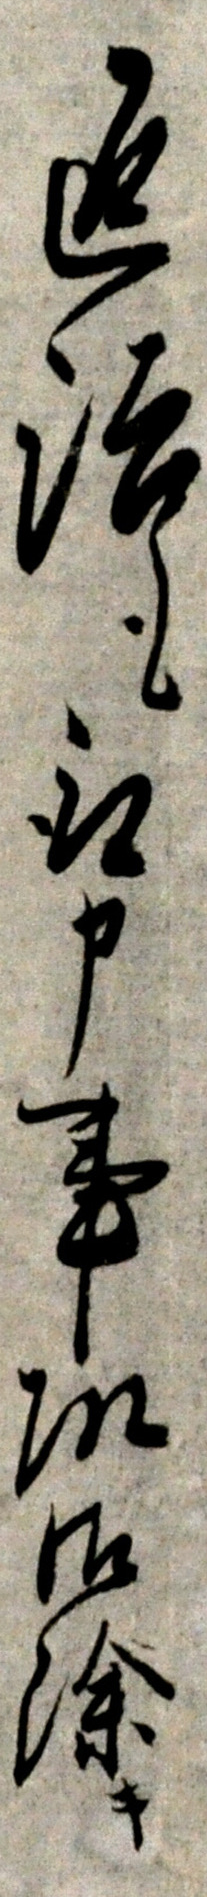返詰も取申事故御除キ
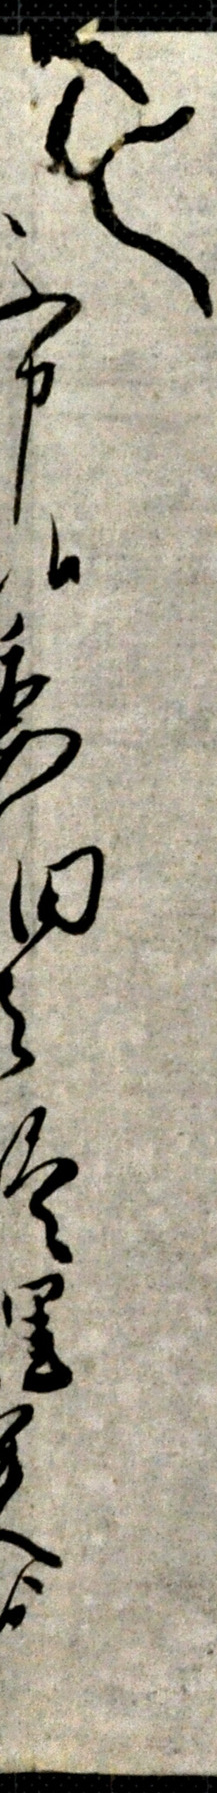不申候委細は修理大夫ゟ
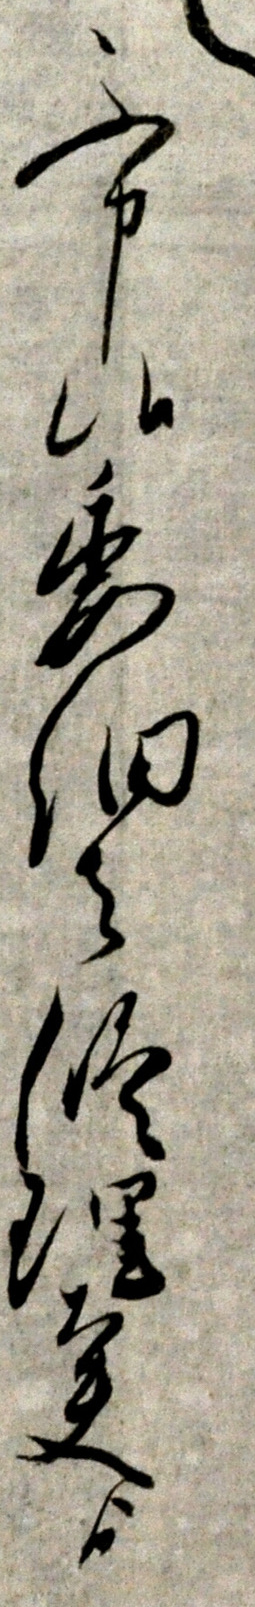不申候委細は修理大夫ゟ
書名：申合帳〔一括〕
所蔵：伊那市立高遠町図書館・合同会社AMANE
